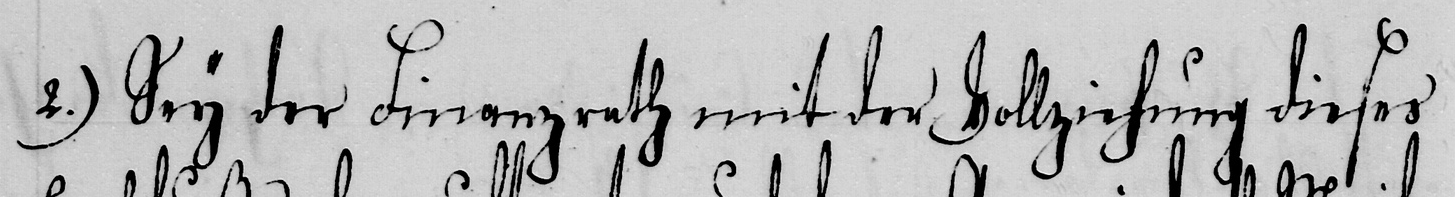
2.) Sey der Finanzrath mit der Vollziehung dieses
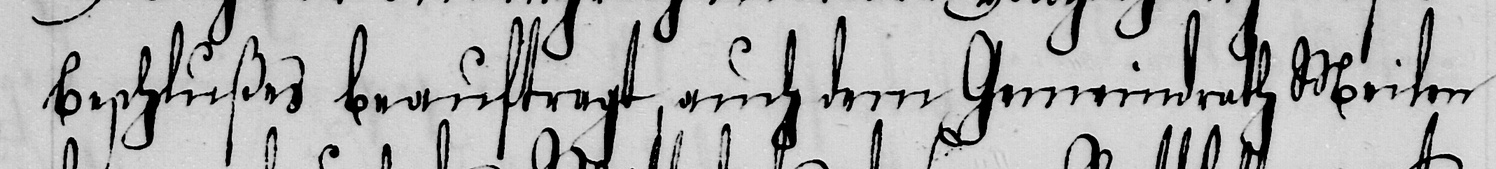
Beschlußes beauftragt, auch dem Gemeindrath Meilen
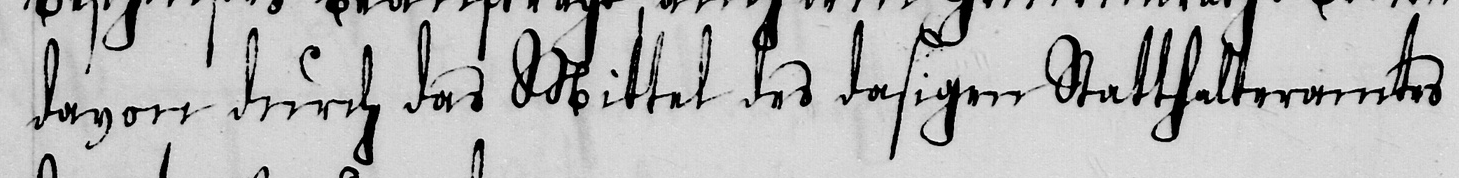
davon durch das Mittel des dasigen Statthalteramtes
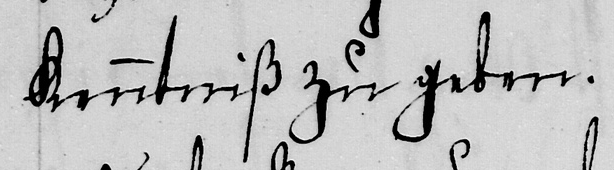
Kenntniß zu geben.
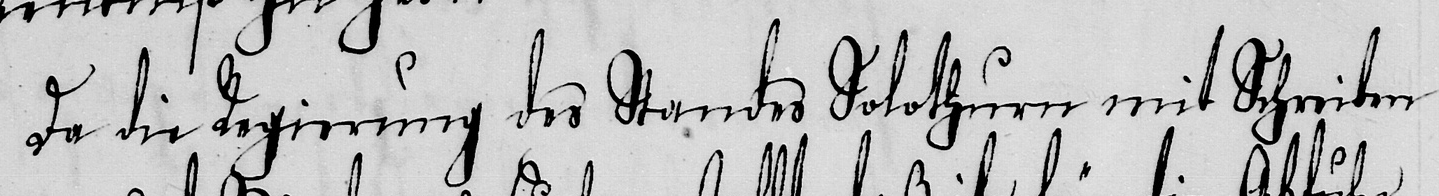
Da die Regierung des Standes Solothurn mit Schreiben
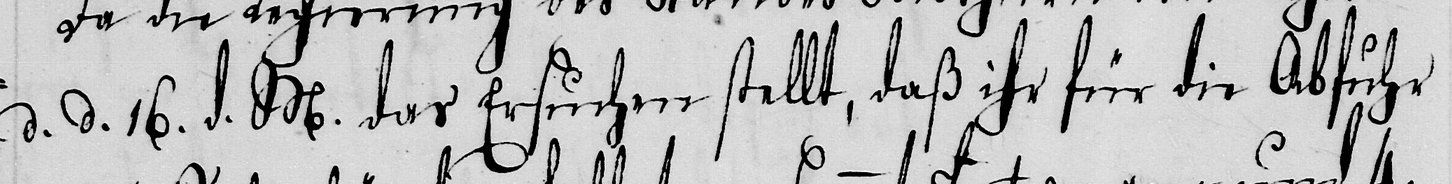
d. 16. d. M. das Ersuchen stellt, daß ihr für die Abfuhr
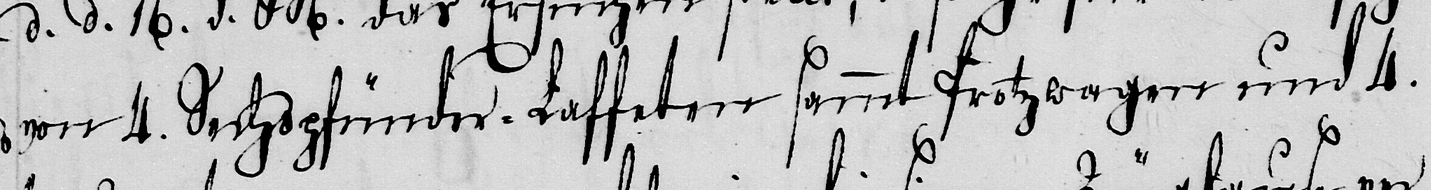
von 4. Sechspfünder-Laffeten sammt Protzwagen und 4.
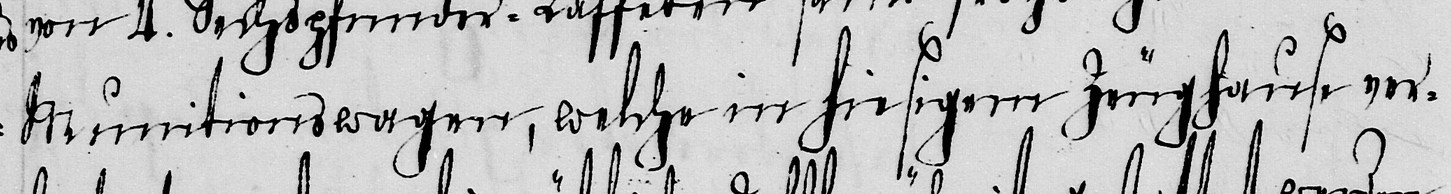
Munitionswagen, welche in hiesigem Zeughause ver¬
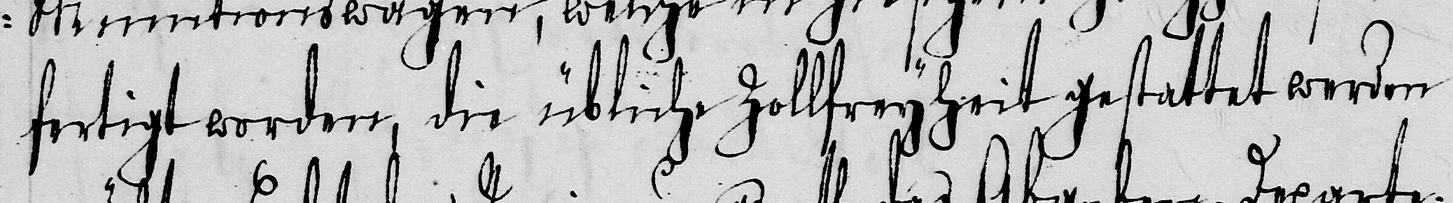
fertigt worden, die übliche Zollfreyheit gestattet werden
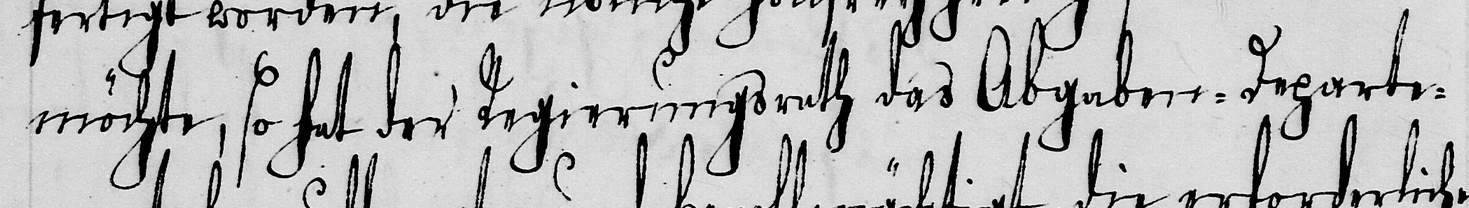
möchte, so hat der Regierungsrath das Abgaben-Departe¬
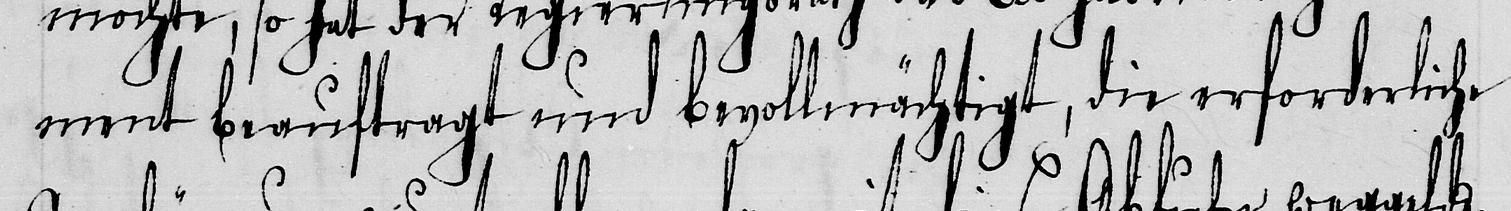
ment beauftragt und bevollmächtigt, die erforderlic¬
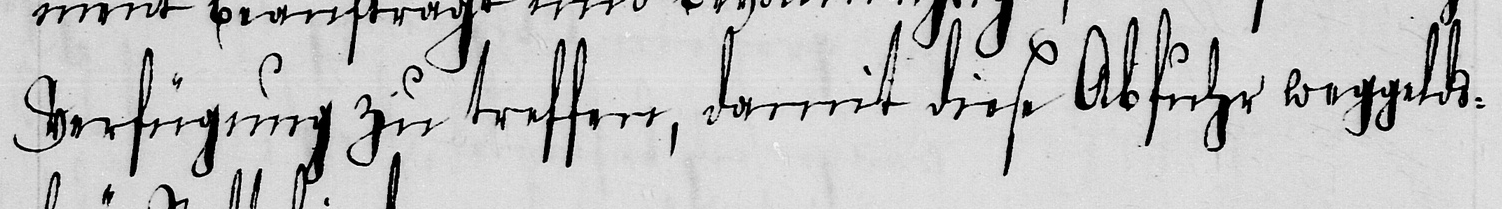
Verfügung zu treffen, damit diese Abfuhr weggelds¬
